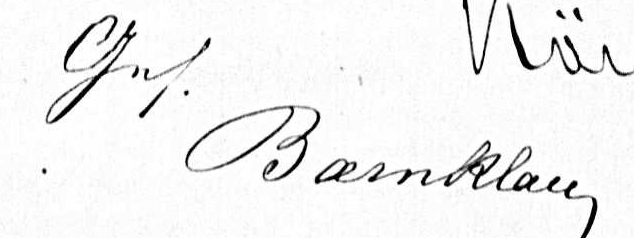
Ges. Bamklau
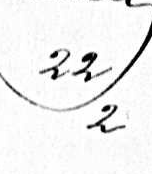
22/2
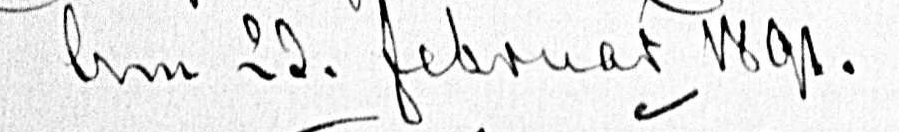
Am 22 February 1891
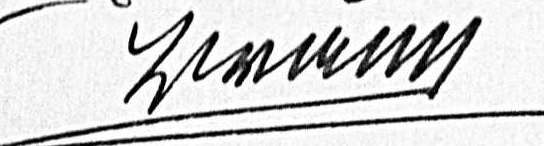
Wrany
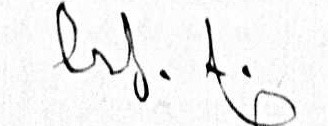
Ah E
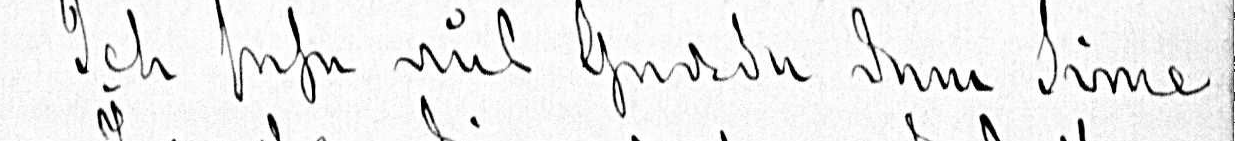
Ich sehe aus Gnade dem Šime
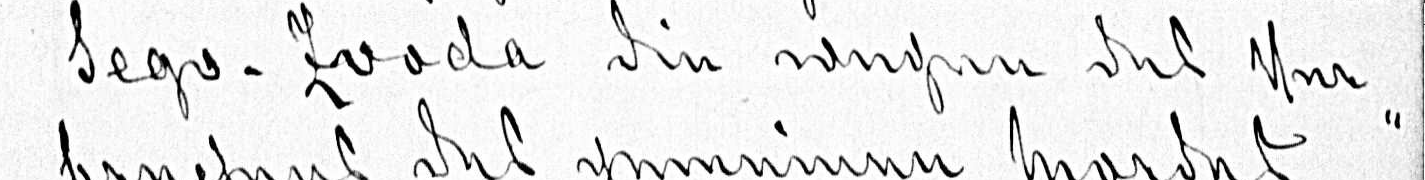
Šego-Žvoda die wegen des Ver¬
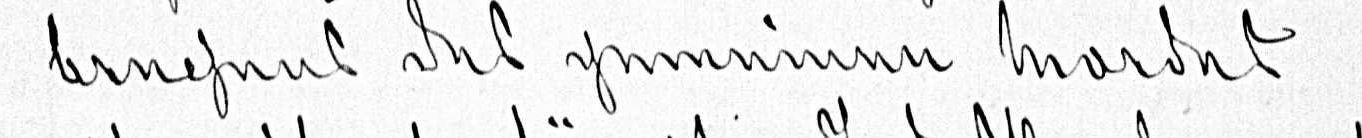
nehmens des gemeinen Mordes
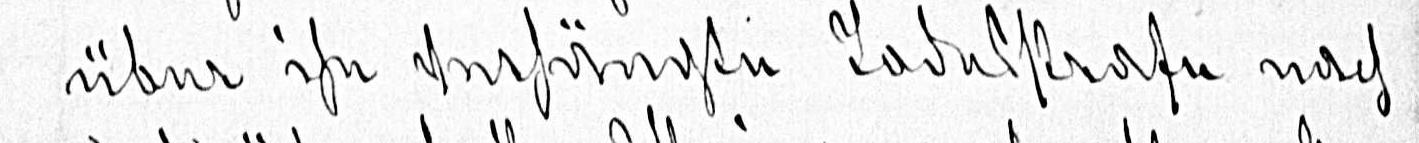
über ihn verhängte Todesstrafe nach
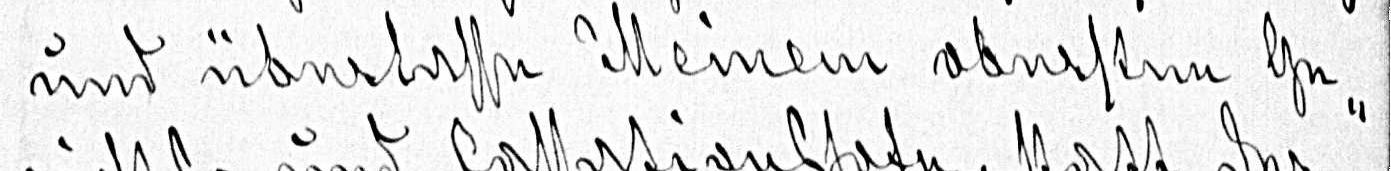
und überlasse Meinem obersten Ge¬
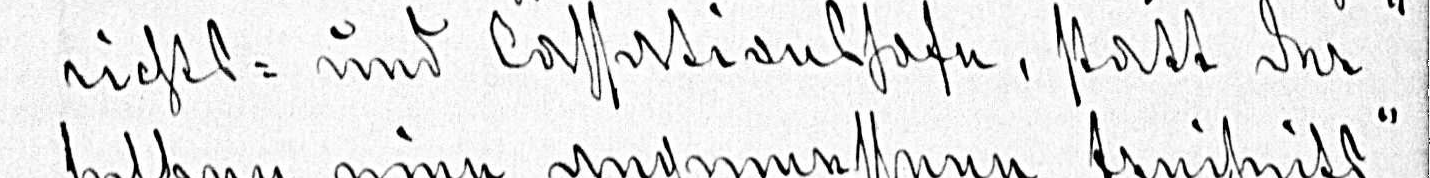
richts- und Cassationshofe, statt der¬
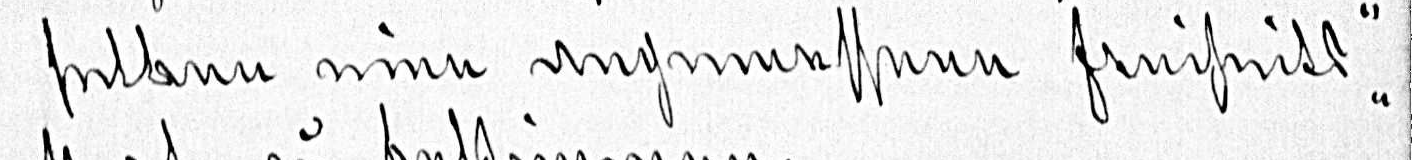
selben eine angemessene Freiheits¬
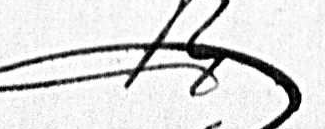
FJ
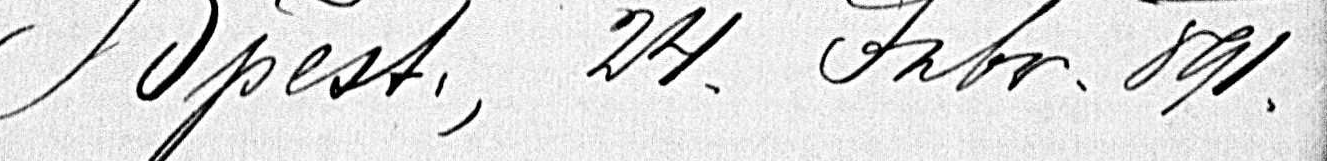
Bpest, 24. Feb 1891
